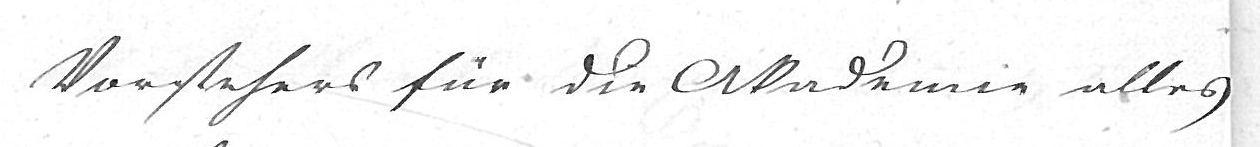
Vorstehers für die Akademie alles
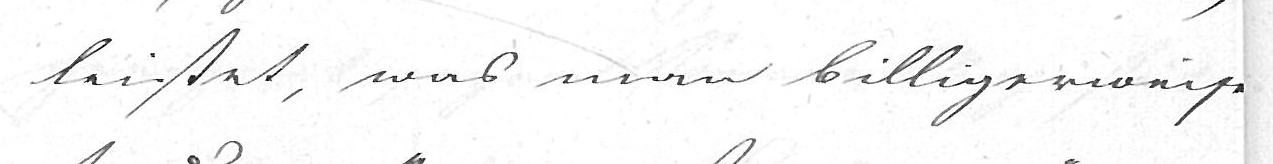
leistet, was man billigerweise
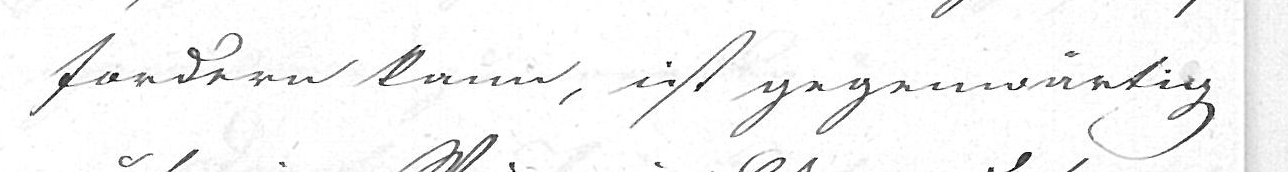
fordern kann, ist gegenwärtig
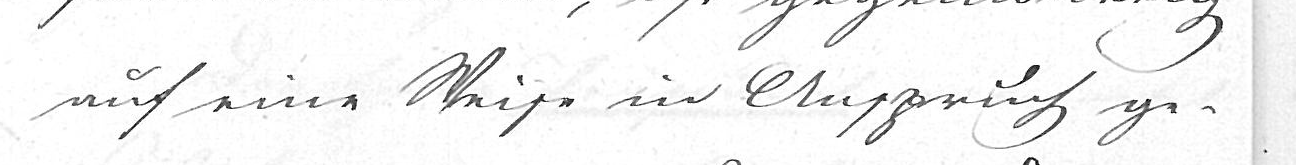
auf eine Weise in Anspruch ge-
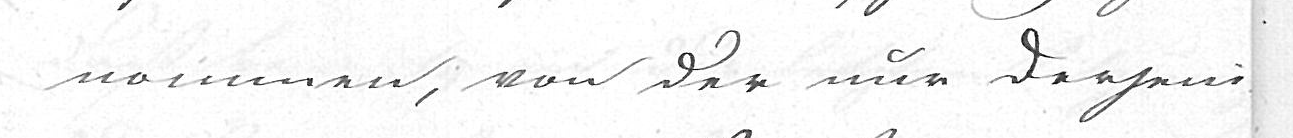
nommen, von der nur derjeni-
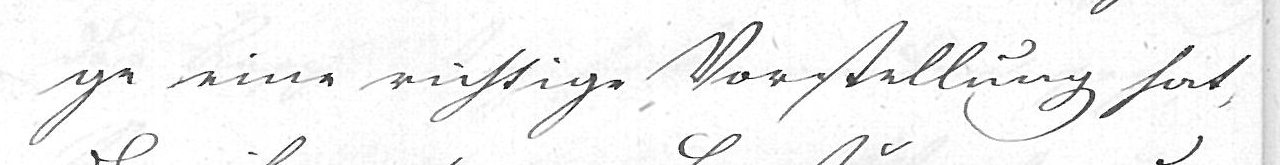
ge eine richtigen Vorstellung hat,
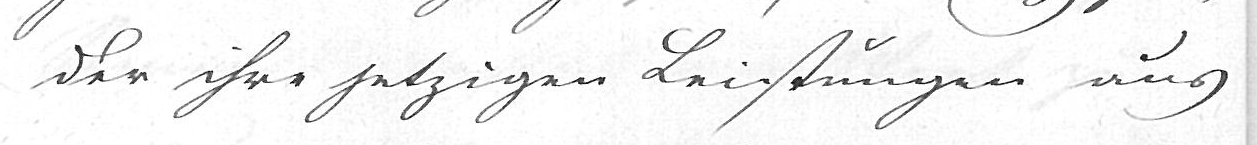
der ihre jetzigen Leistungen aus
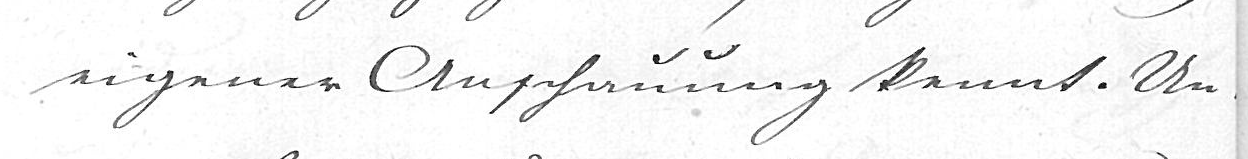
eigener Anschannng kennt. Un-
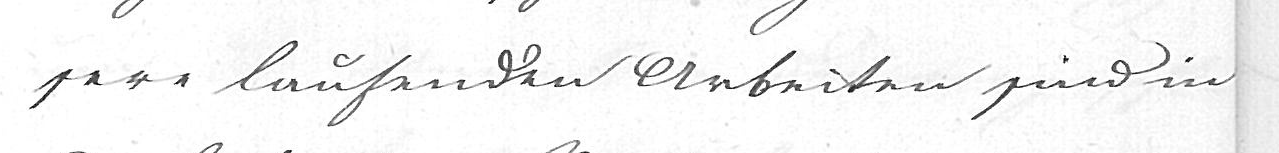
sere laufenden Arbeiten sind in
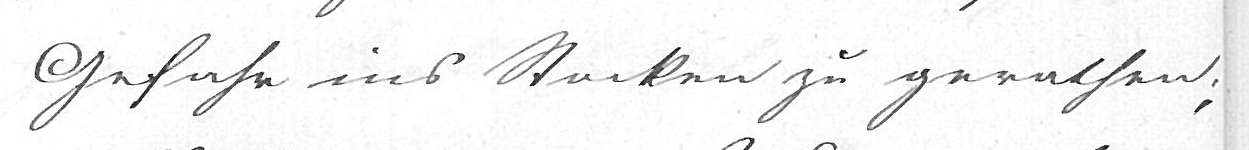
Gefahr uns Stocken zu gerathen.;
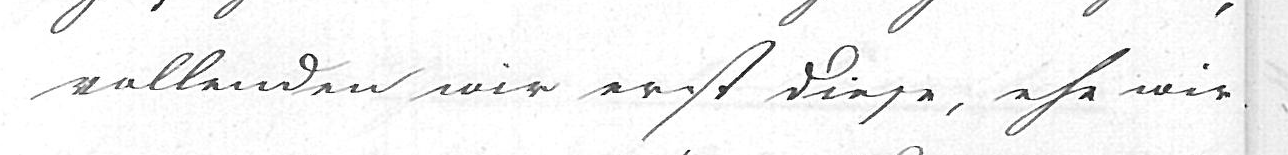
vollenden wir erst diese, ehe wir
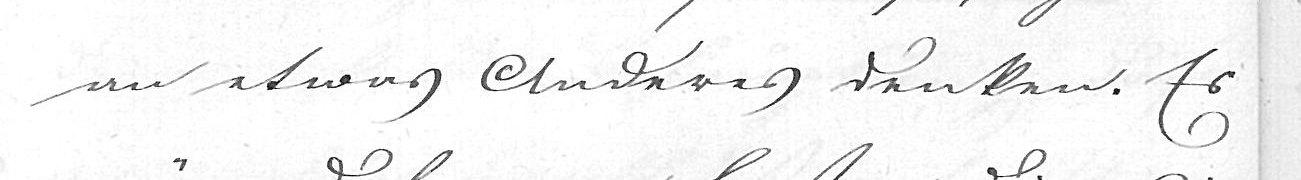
an etwas Anderes denken. Es
